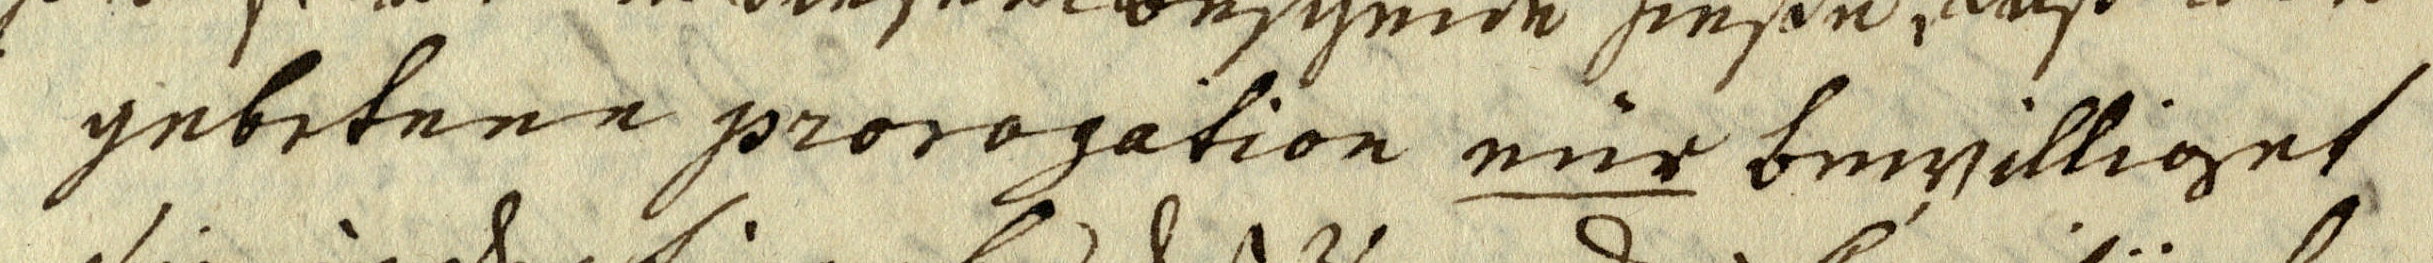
gebetene prorogation nur bewilliget
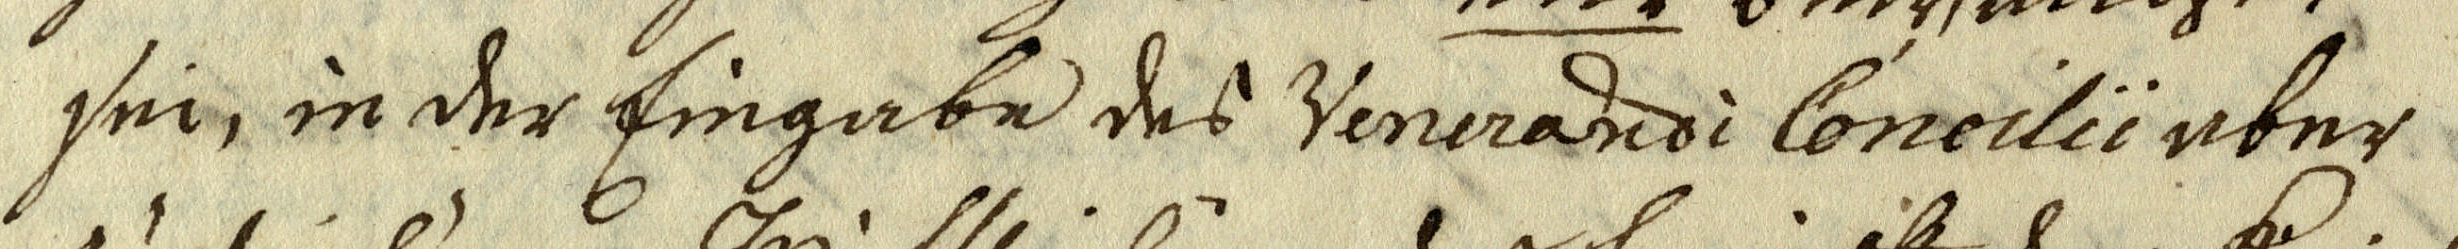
sei, in der Eingabe des Venerandi Concilii aber
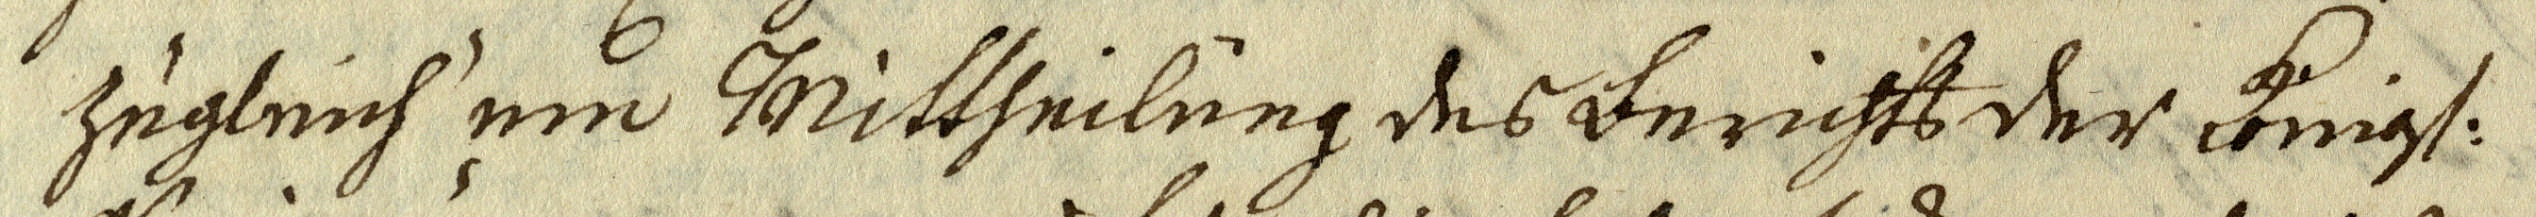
zugleich um Mittheilung des Berichts der Königl.
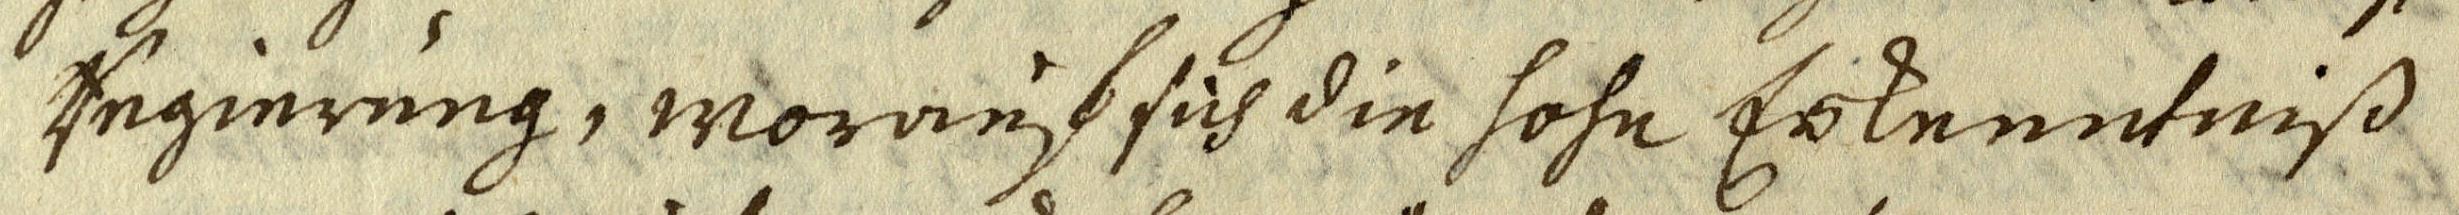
Regierung, worauf sich die hohe Erkenntniß
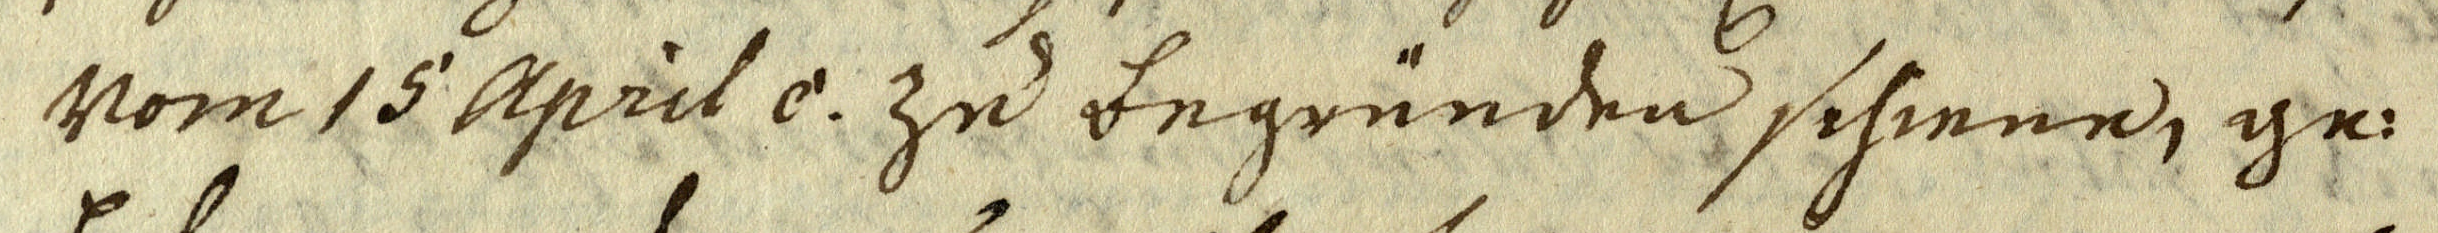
vom 15 April c. zu begründen schiene, ge¬
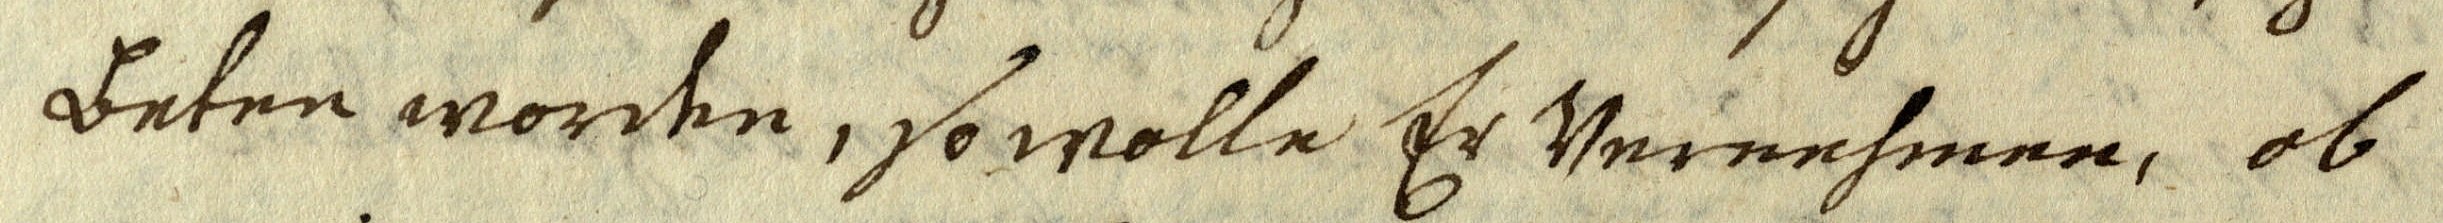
beten worden, so wolle Er vernehmen, ob
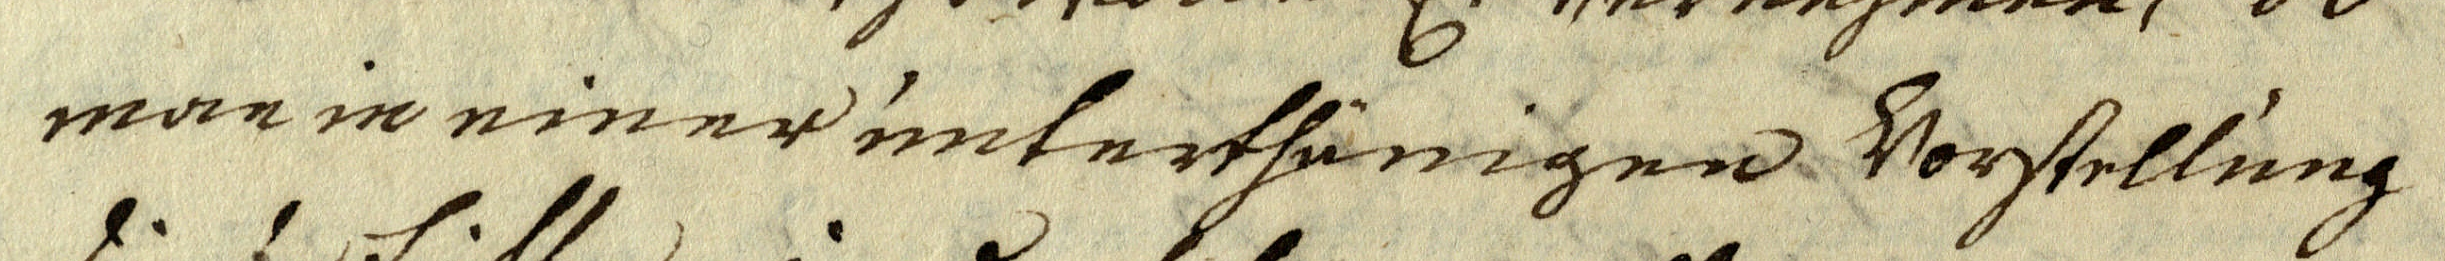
man in einer unterthänigen Vorstellung
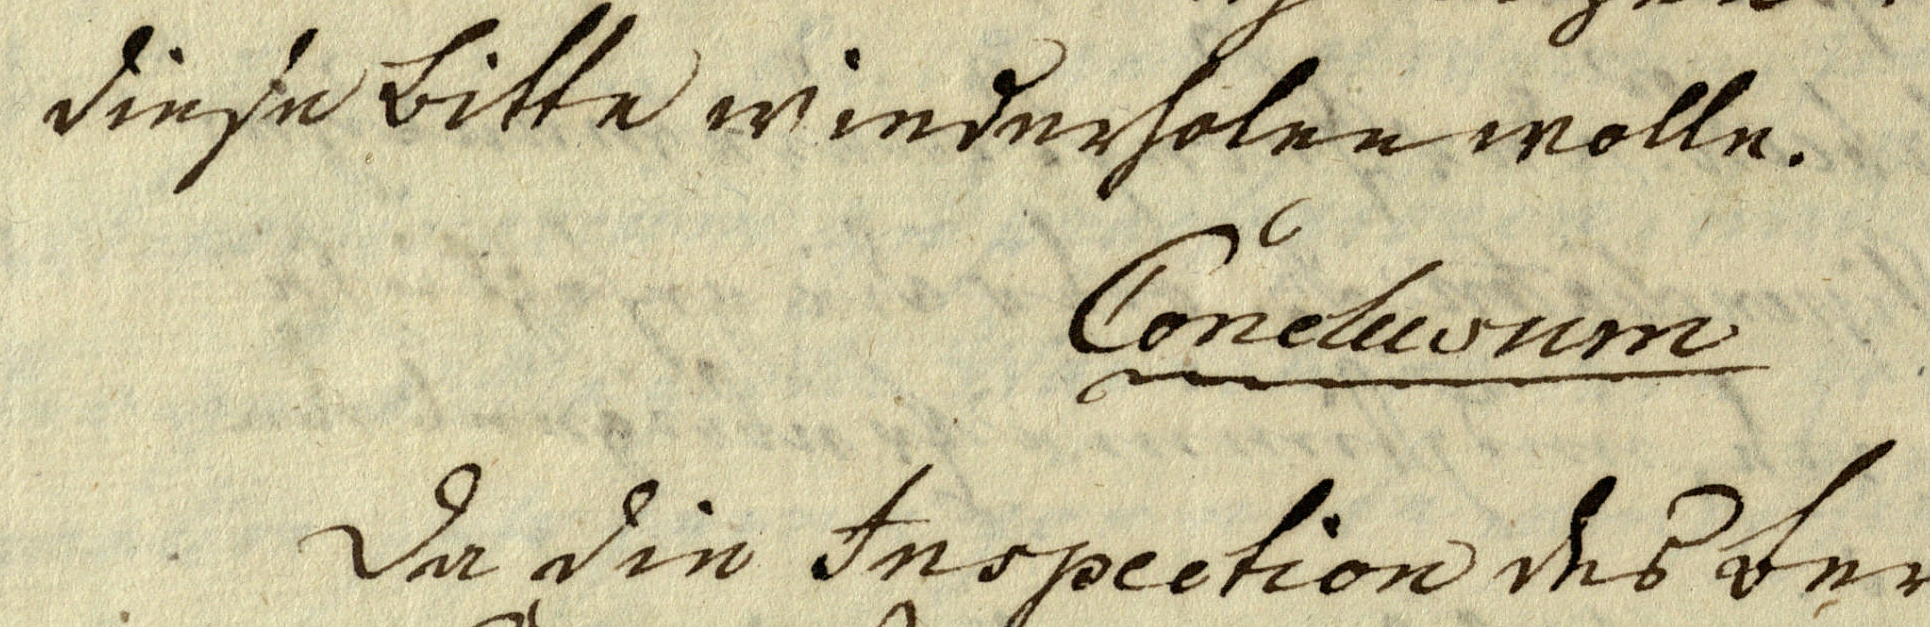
dies Bitte wiederholen wolle.
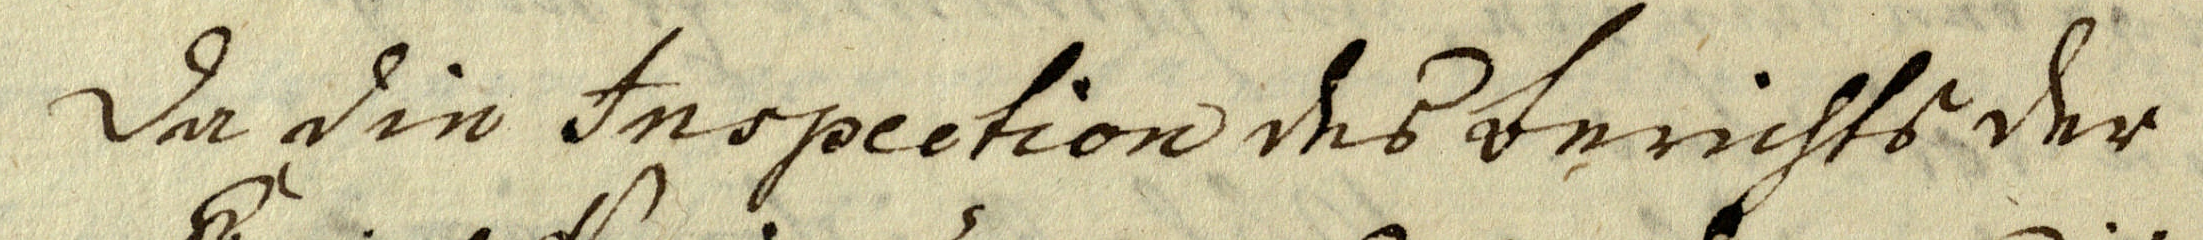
da die Inspection des Berichts der
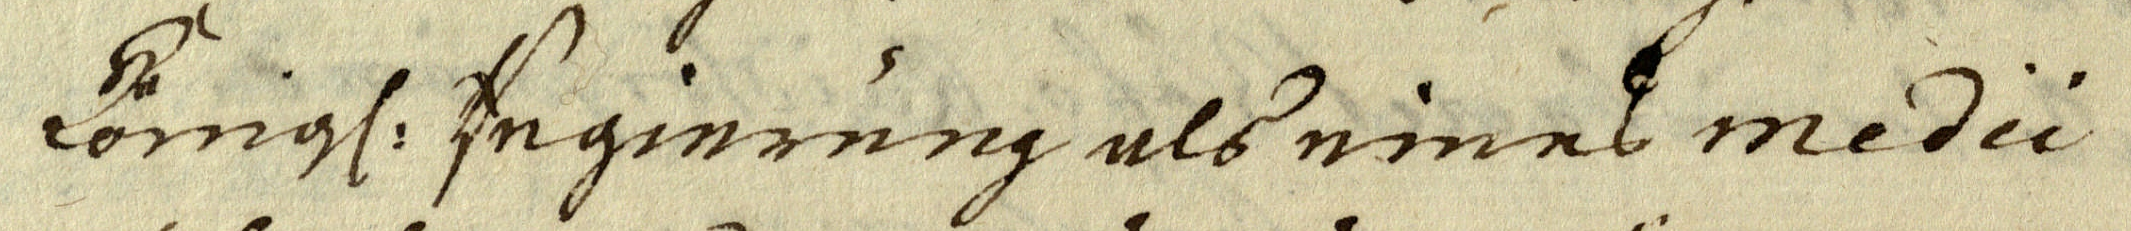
Königl. Regierung als eines medii
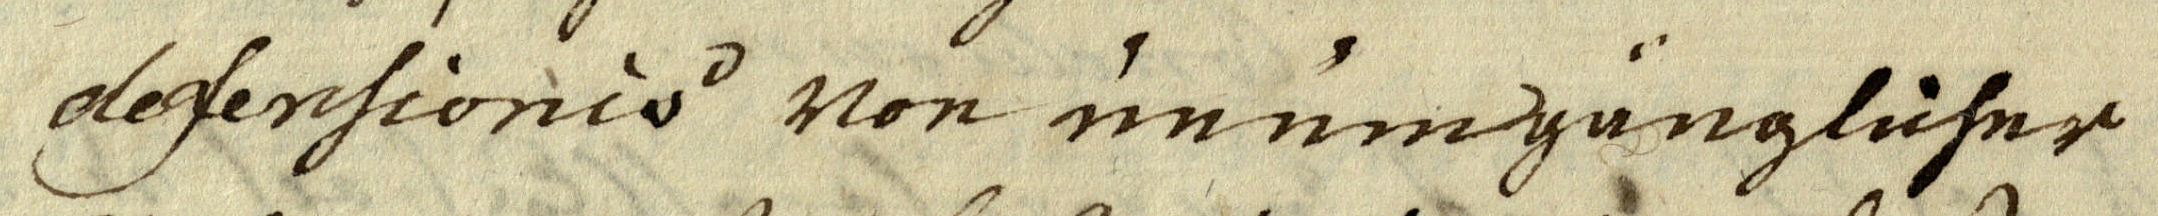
defensionis von unumgänglicher
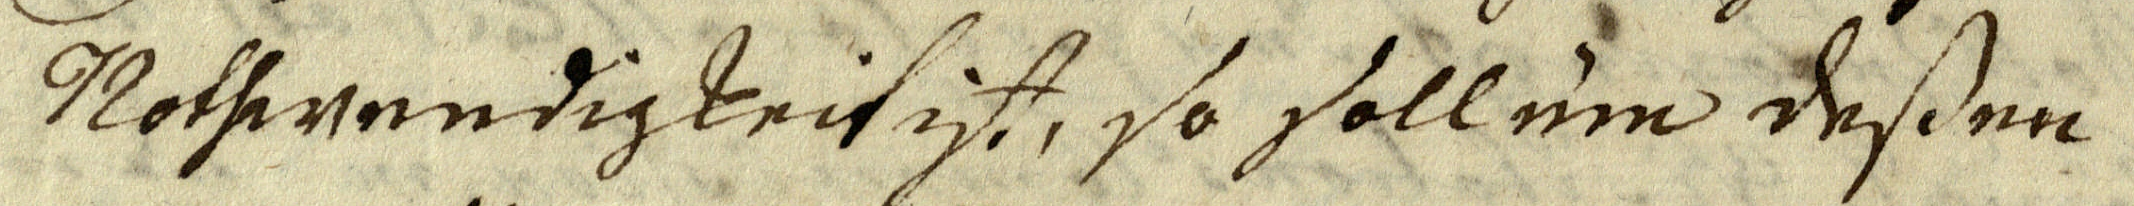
Nothwendigkeit ist, so soll um deßen
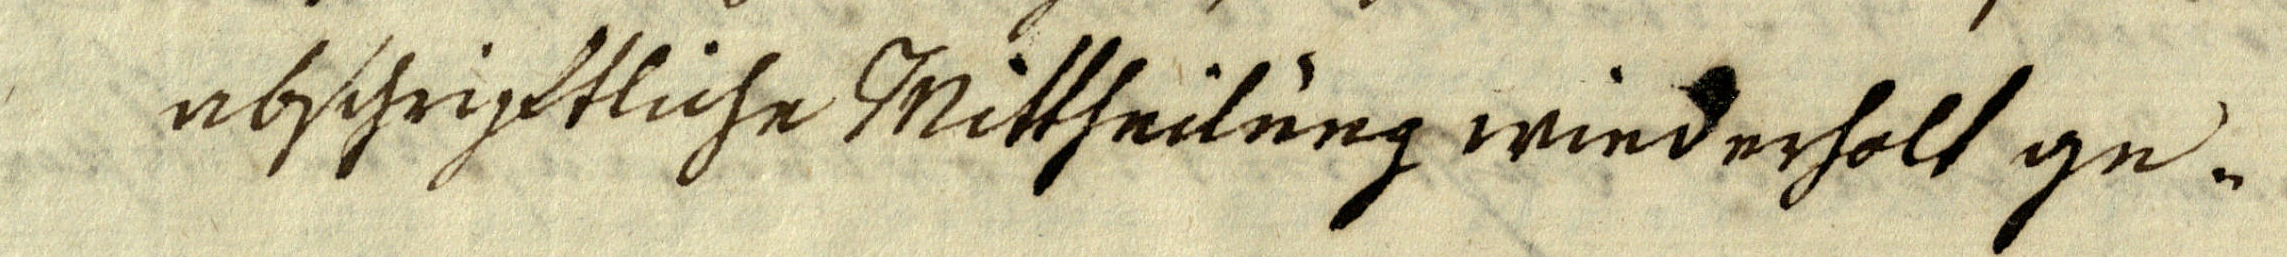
abschriftliche Mittheilung wiederholt ge¬
